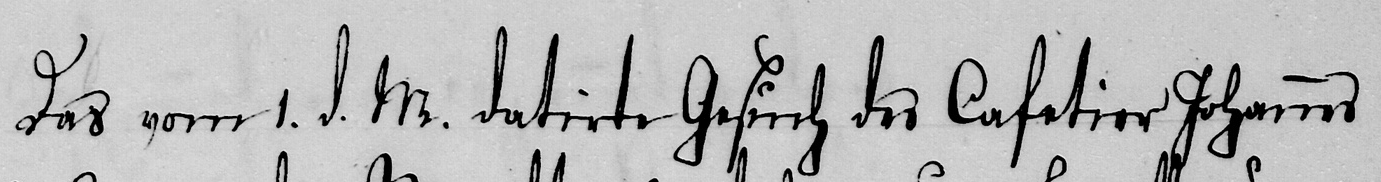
Das vom 1. d. M. datirte Gesuch des Cafetier Johannes
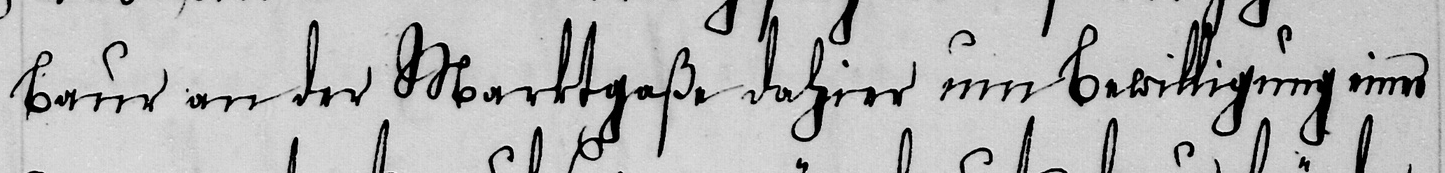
Baur an der Marktgaße dahier um Bewilligung eines
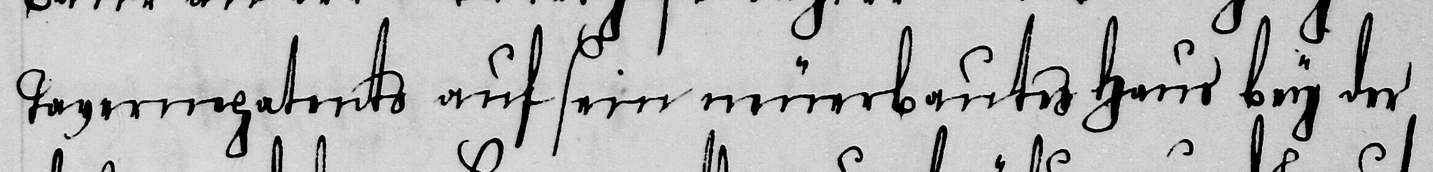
Tavernepatents auf sein neuerbautes Haus bey der
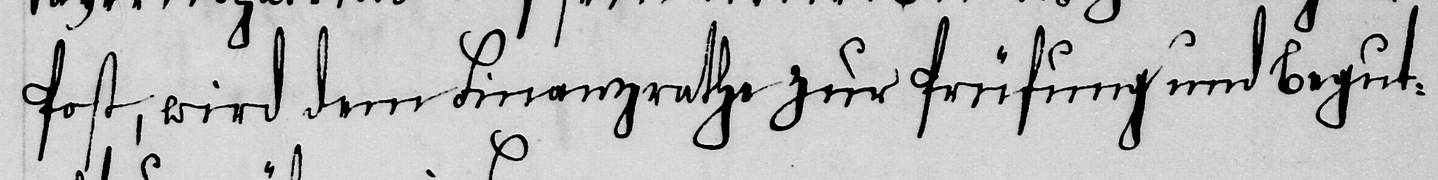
Post, wird dem Finanzrathe zur Prüfung und Begut¬
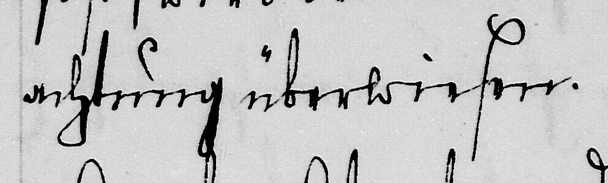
achtung überwiesen.
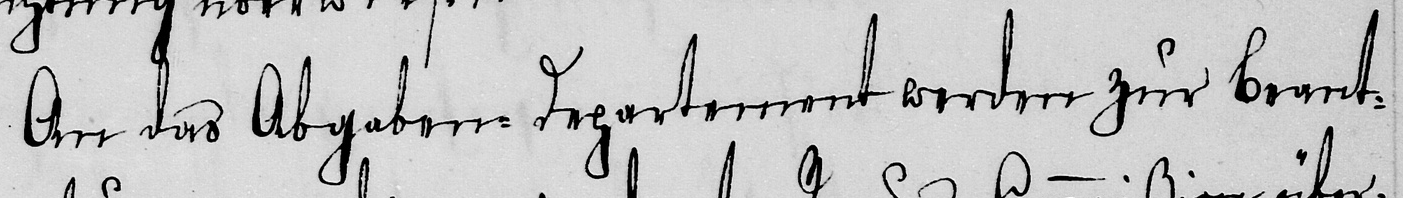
An das Abgaben-Departement werden zur Beant¬
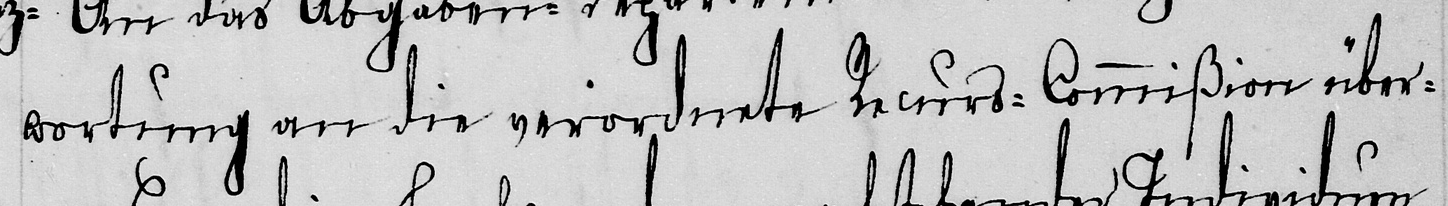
wortung an die verordnete Recurs-Commißion über¬
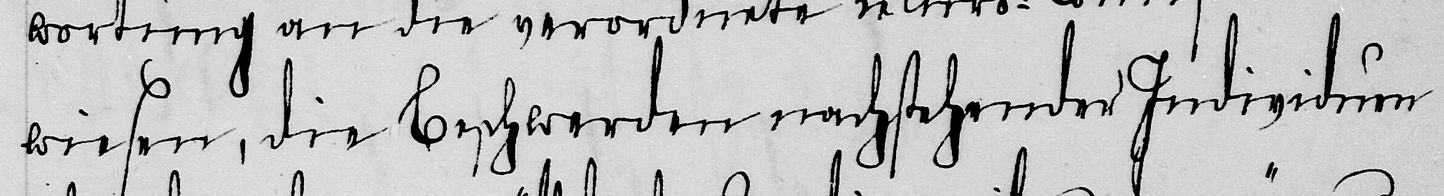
wiesen, die Beschwerden nachstehender Individuen
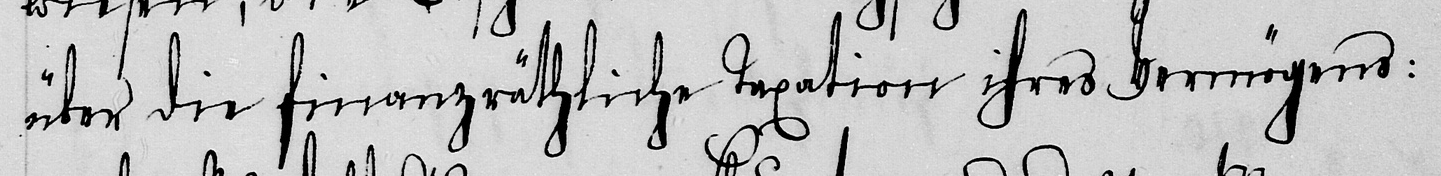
über die finanzräthliche Taxation ihres Vermögens:
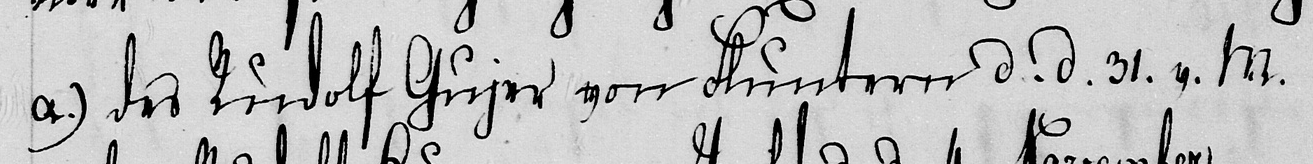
a.) des Rudolf Gujer von Fluntern d. d. 31. v. M.
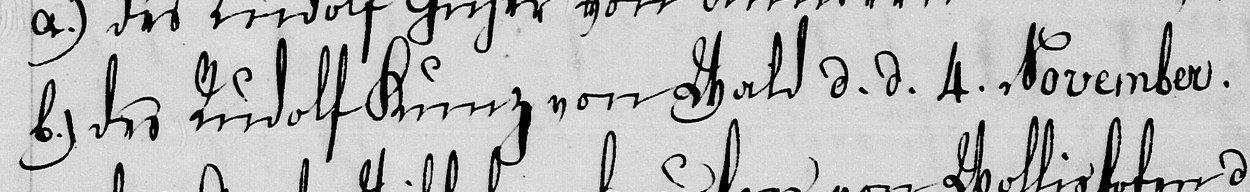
b.) des Rudolf Kunz von Wald d. d. 4. November.
